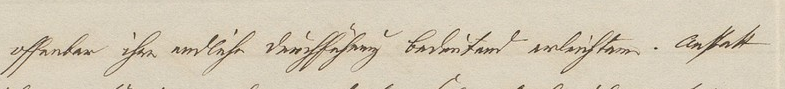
offenbar ihre endliche Durchführung bedeutend erleichtern. Anstatt
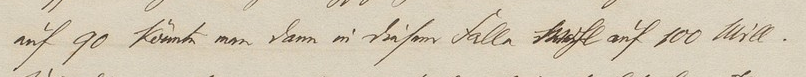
auf 90 könnte man dann in diesem Falle wohl auf 100 Mill.
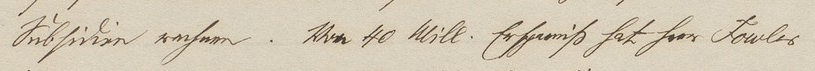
Subsidien rechnen. Von 40 Mill. Ersparniß hat Herr Fowler
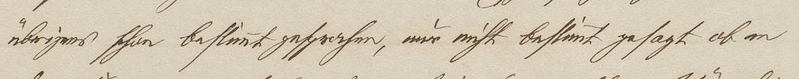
übrigens schon bestimmt gesprochen, nur nicht bestimmt gesagt ob an
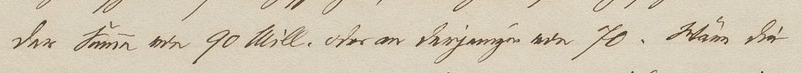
der Summe von 90 Mill. oder an derjenigen von 70. Wäre die
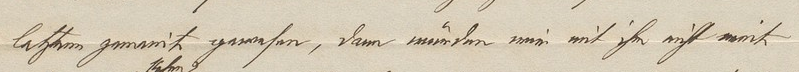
letztere gemeint gewesen, dann würden wir mit ihm nicht weit
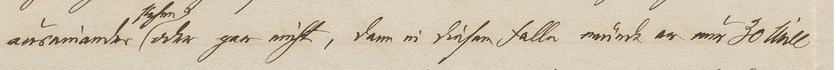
auseinander stehen oder gar nicht, denn in diesem Falle würde er nur 30 Mill
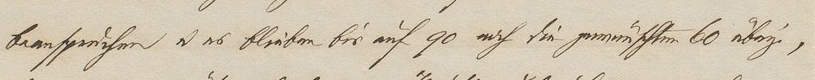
beanspruchen & es blieben bis auf 90 noch die gewünschten 60 übrig,
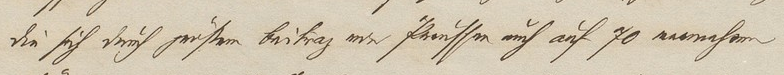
die sich durch größern Beitrage von Preussen auch auf 70 vermehren
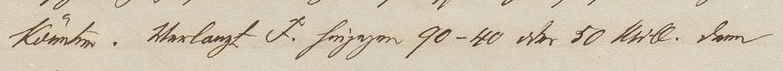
könnten. Verlangt F. hingegen 90–40 oder 50 Mill. dann
